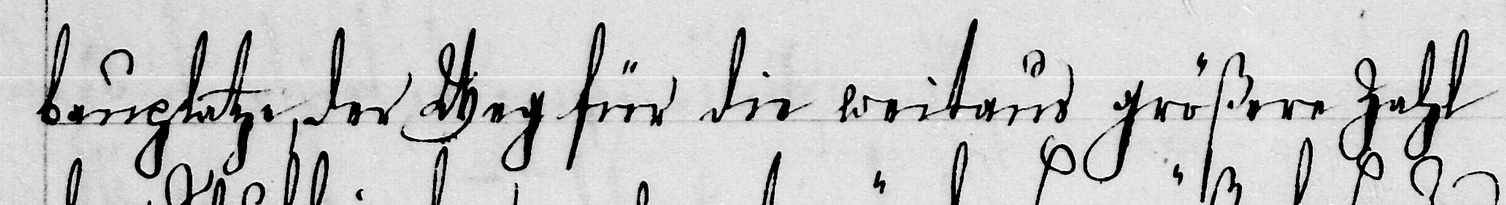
bauplatze, der Weg für die weitaus größere Zahl
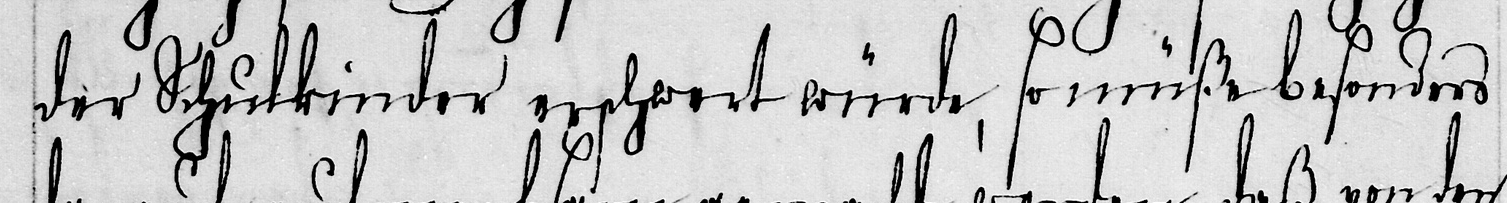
der Schulkinder erschwert würde, so müße besonders
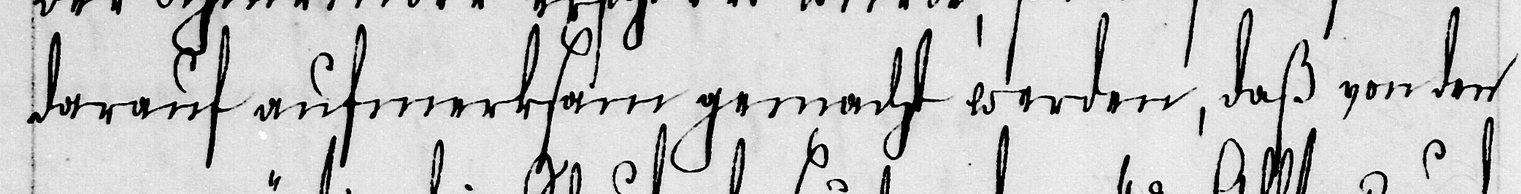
darauf aufmerksam gemacht werden, daß von den
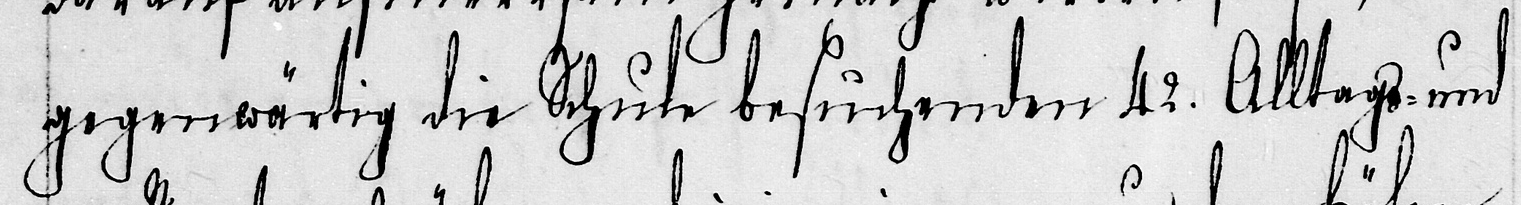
gegenwärtig die Schule besuchenden 42. Alltags- und
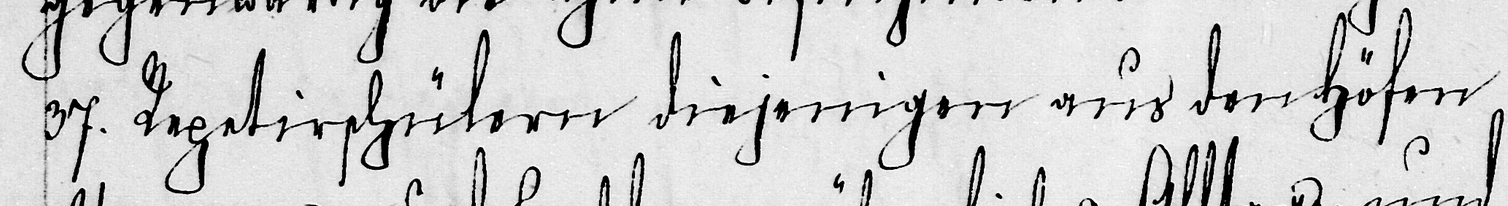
37. Repetirschülern diejenigen aus den Höfen
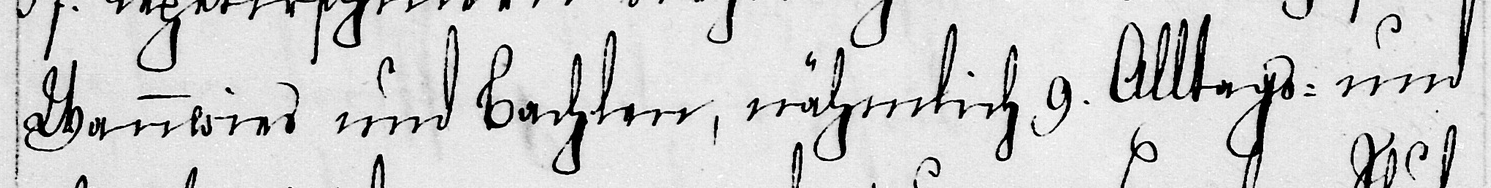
Wannwies und Bachlen, nähmlich 9. Alltags- und
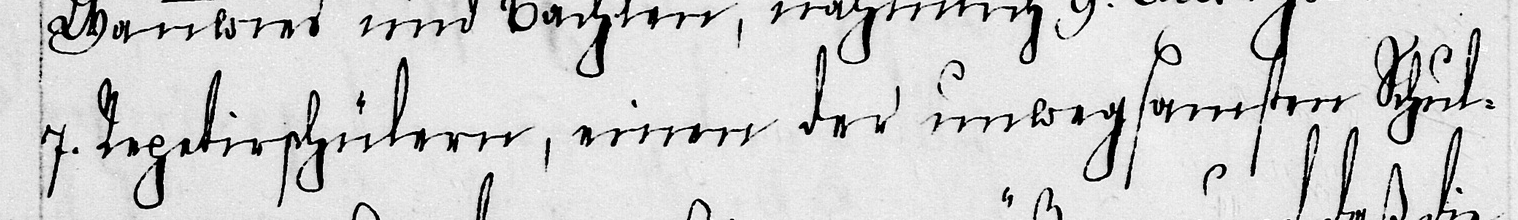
7. Repetirschülern, einen der unwegsamsten Schul¬
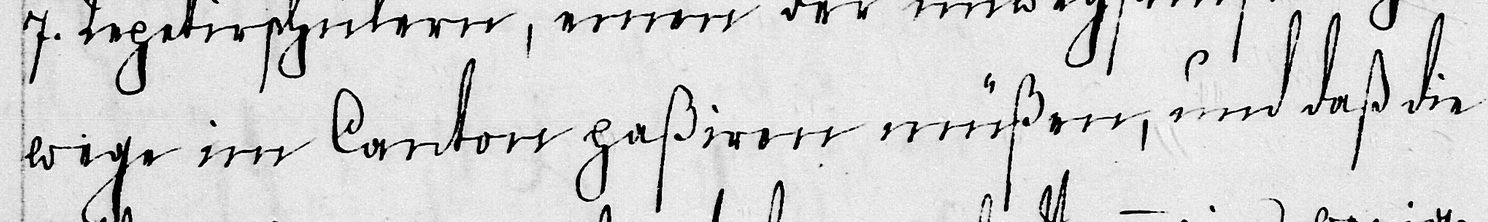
wege im Canton paßiren müßen, und daß die
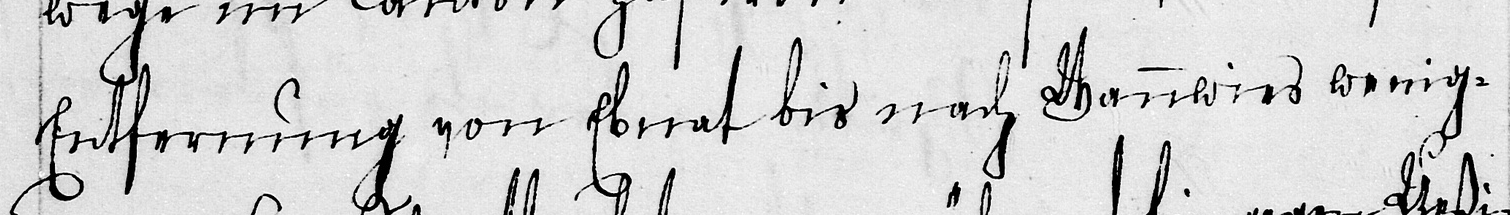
Entfernung von Ebnat bis nach Wannwies wenig¬
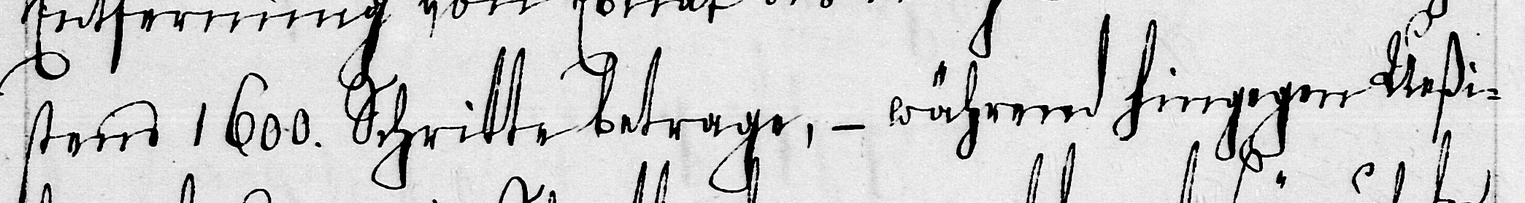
stens 1600. Schritte betrage, – während hingegen Ueßi¬
